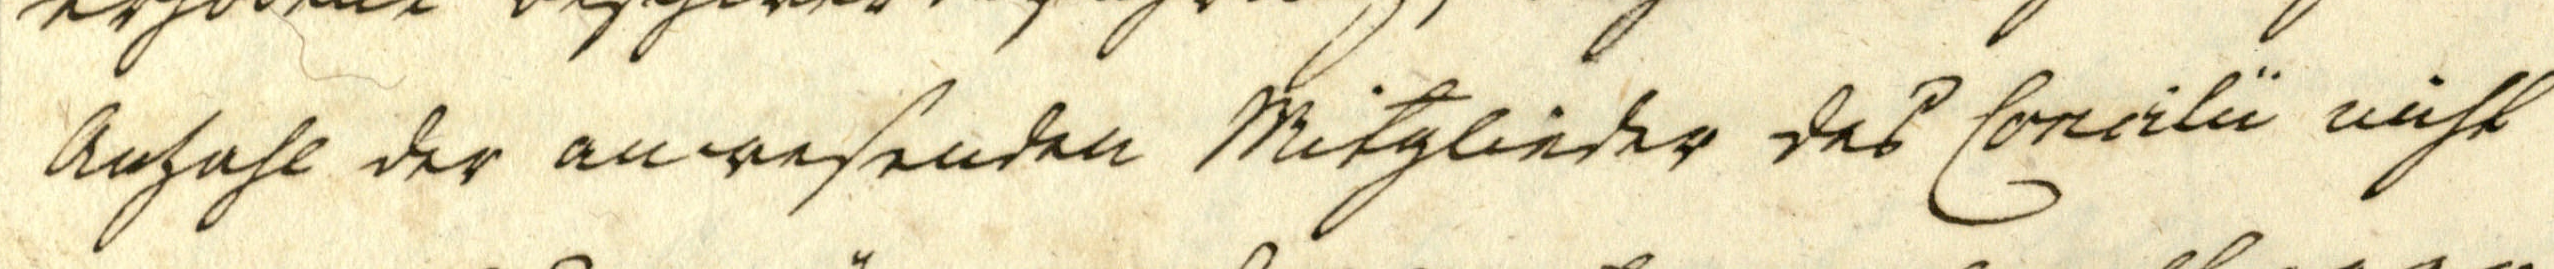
Anzahl der anwesenden Mitglieder des Concilii nicht
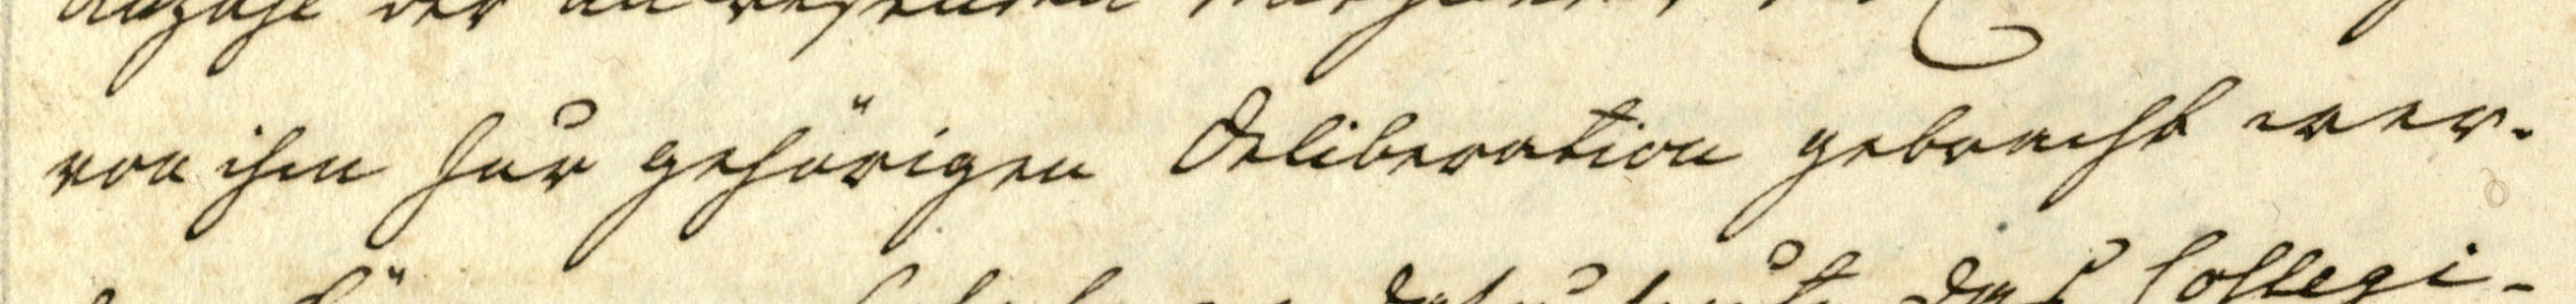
von ihm zur gehörigen Deliberation gebracht wer¬
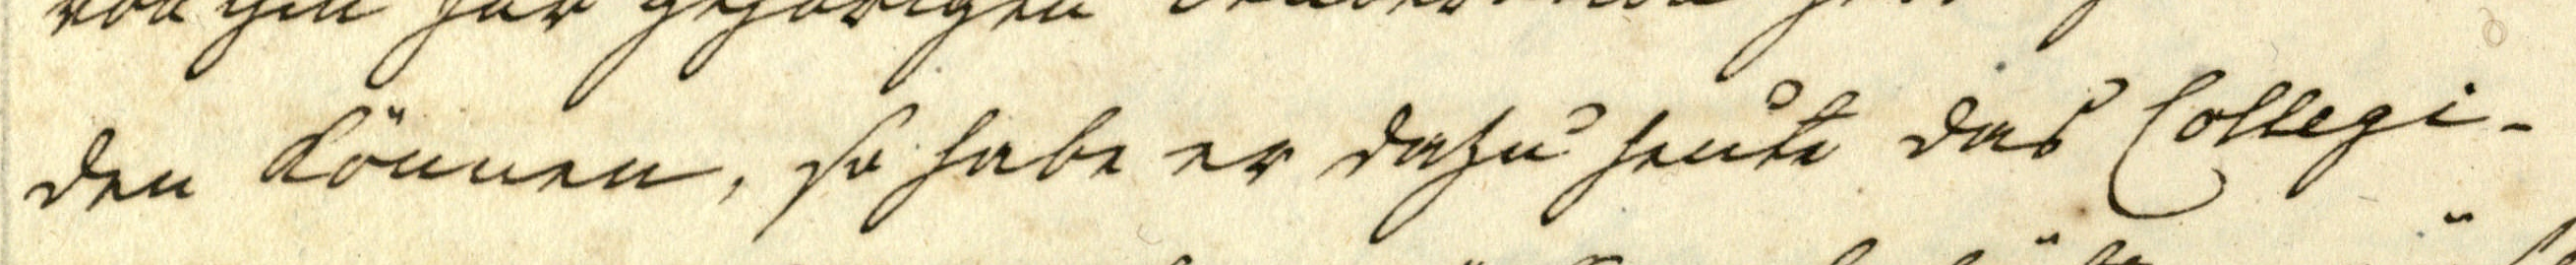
den können, so habe er dazu heute das Collegi¬
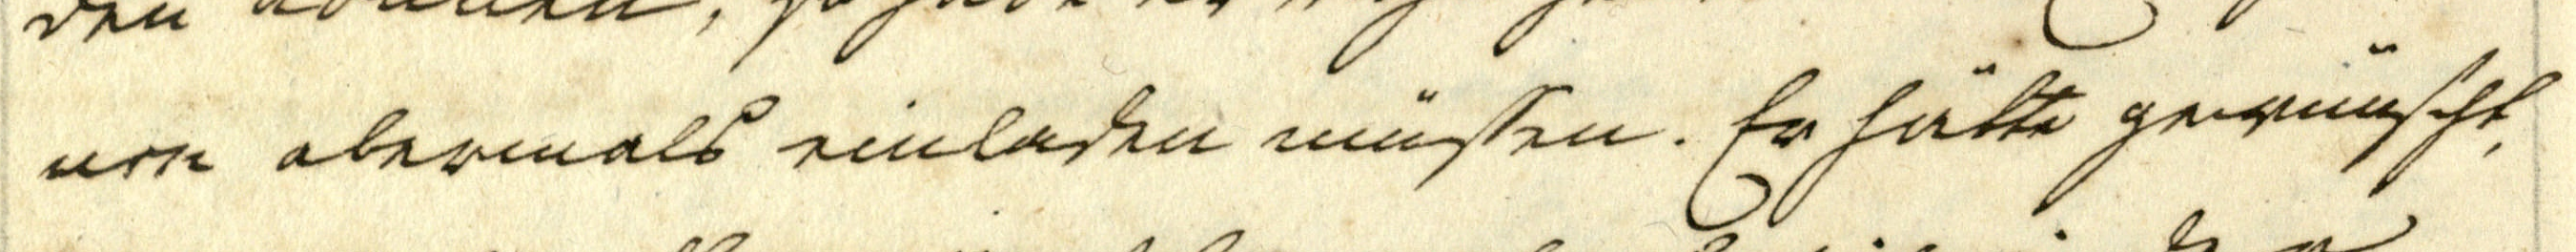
um abermals einladen müssen. Er hätte gewünscht,
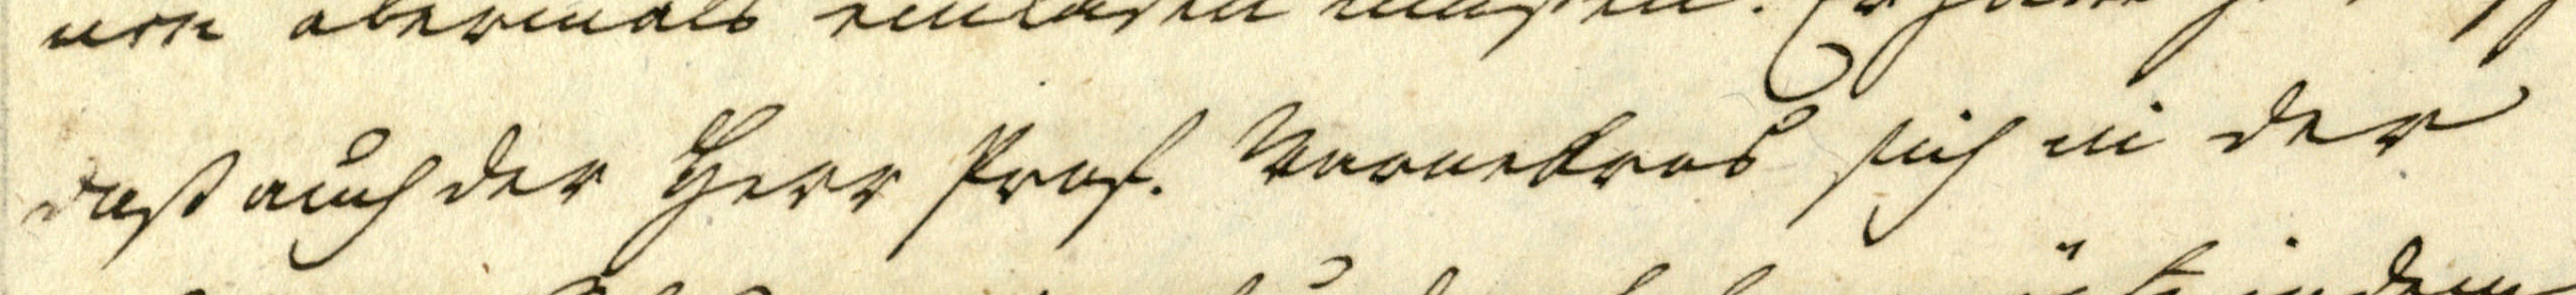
daß auch der Herr Prof. Warnekros sich in der
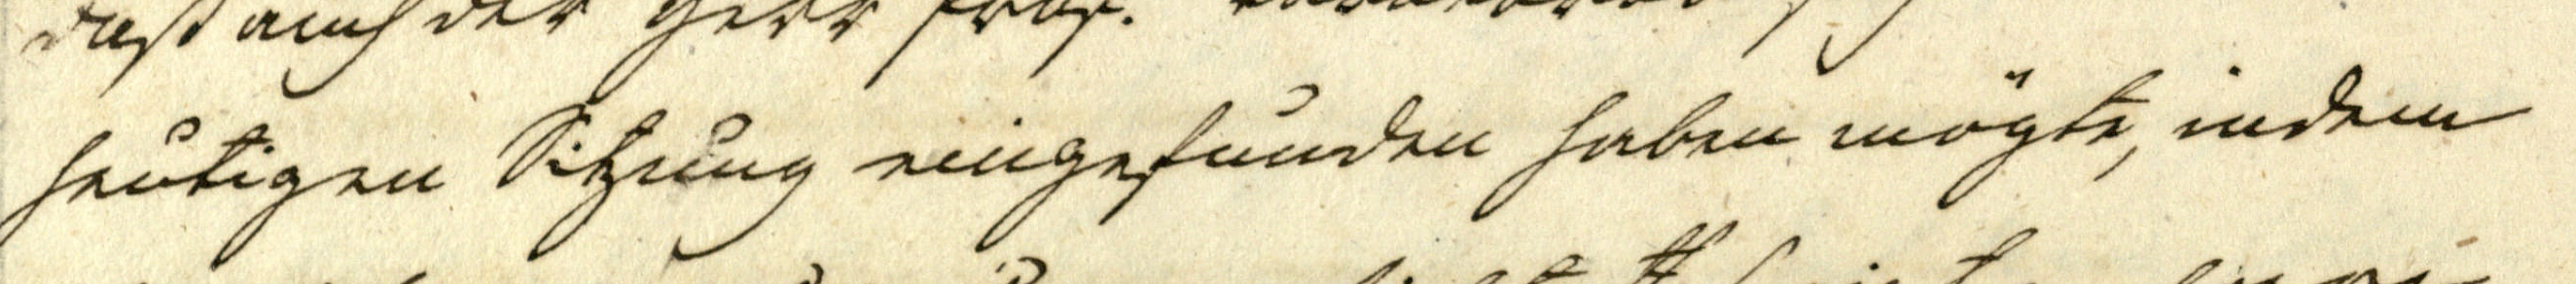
heutigen Sitzung eingefunden haben mögte, indem
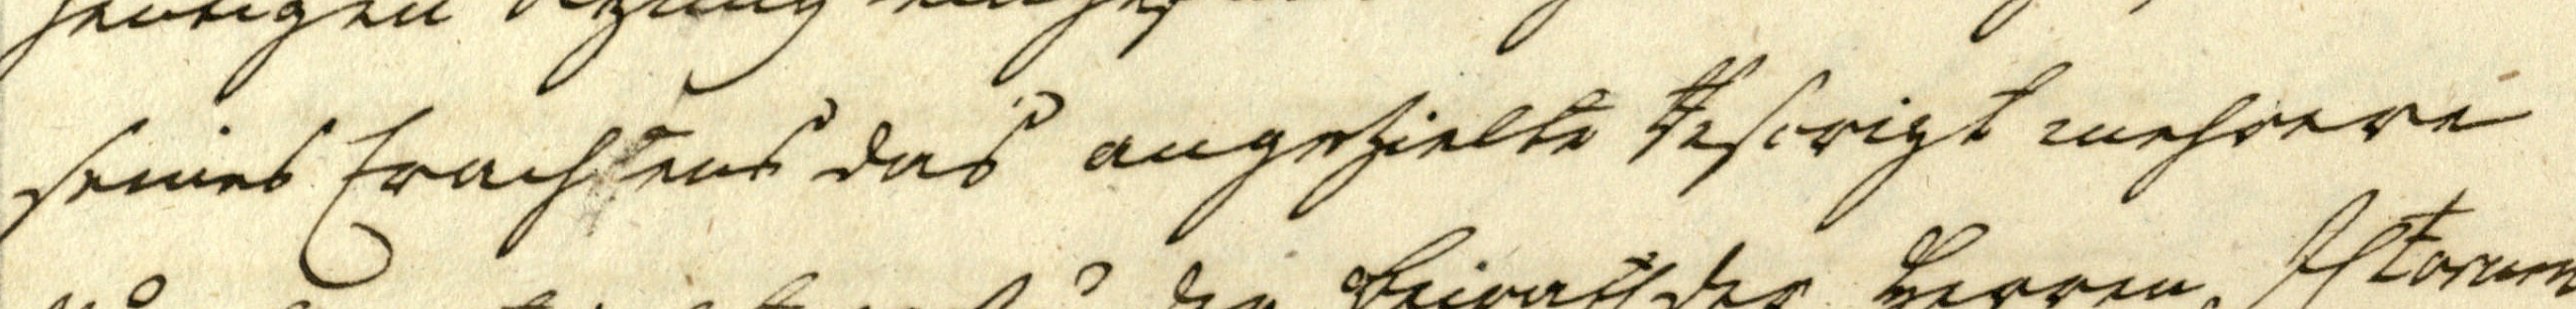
seines Erachtens das angezielte Rescript mehrere
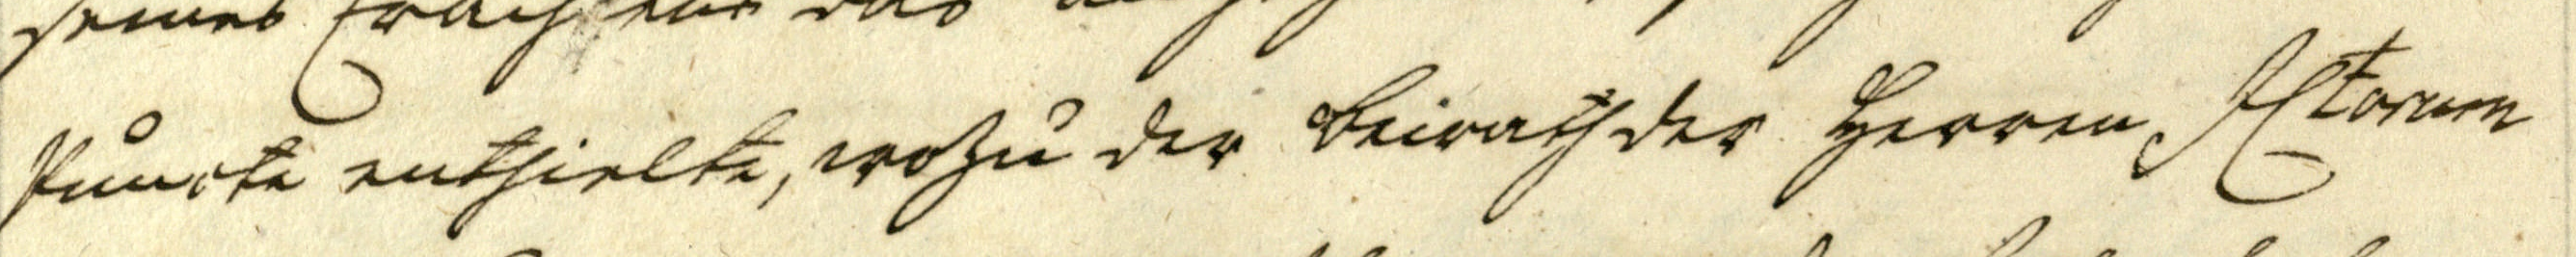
Puncte enthielte, wozu der Beirath der Herren Iltorum
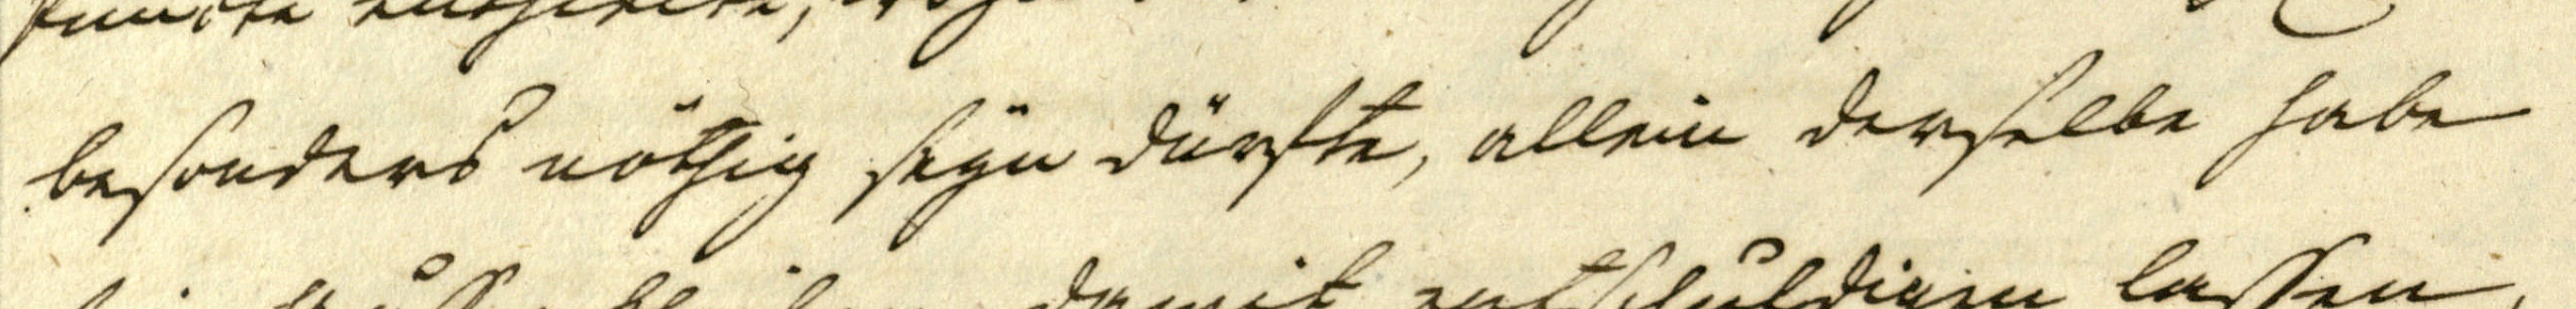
besonders nöthig seÿn dürfte, allein derselbe habe
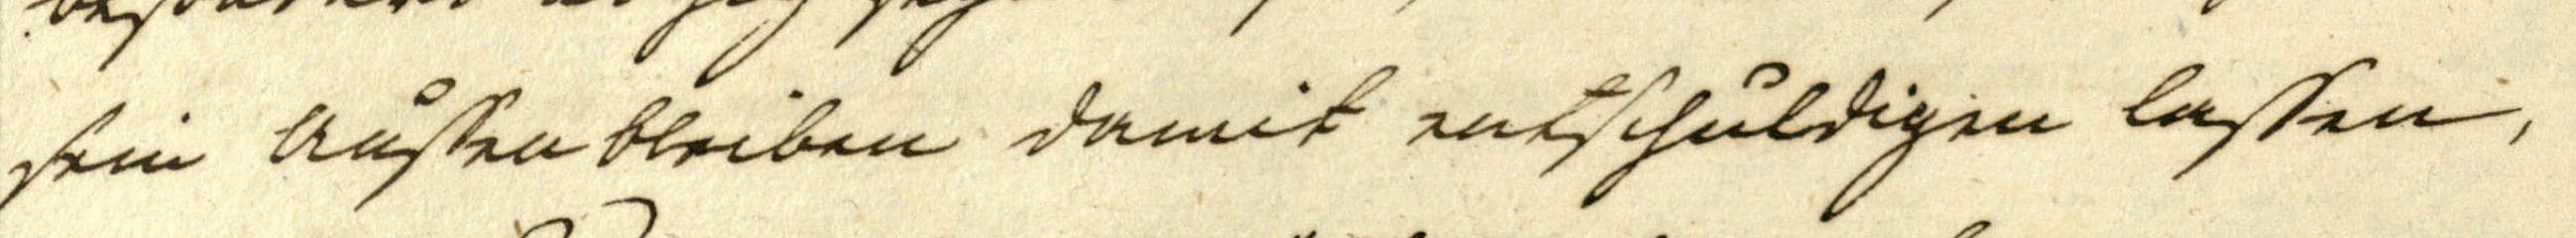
sein Aussenbleiben damit entschuldigen lassen,
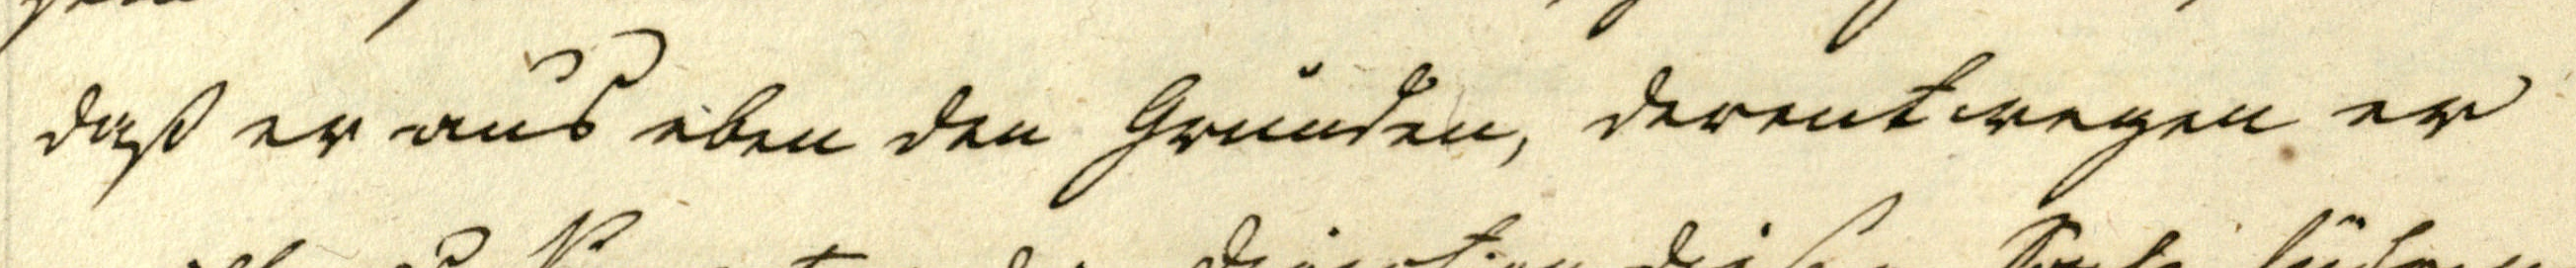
daß er aus eben den Gründen, derent wegen er
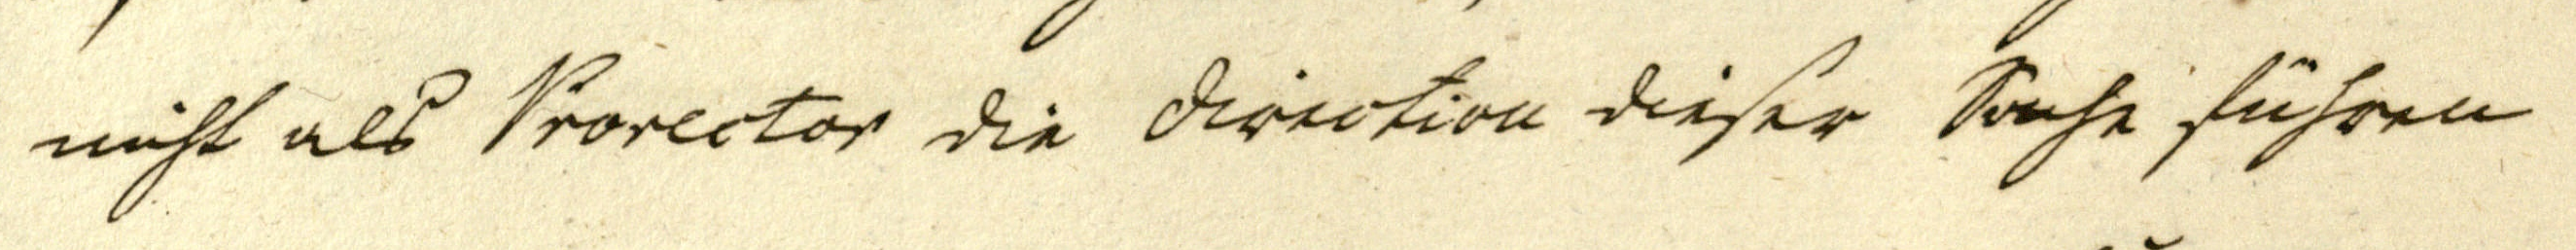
nicht als Prorector die Direction dieser Sache führen
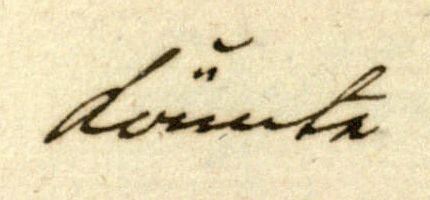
könnte.
